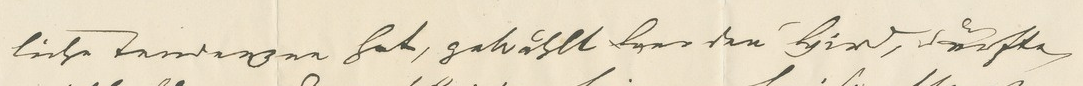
liche Tendenzen hat, gewählt werden wird, dürfte
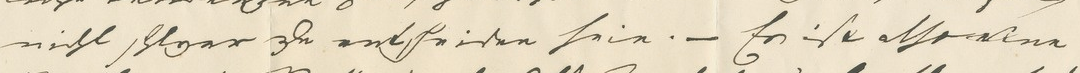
nicht schwer zu entscheiden sein. – Es ist also eine
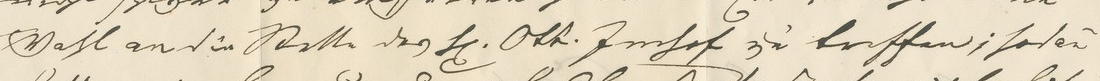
Wahl an die Stelle des H. Ott-Imhof zu treffen; sodann
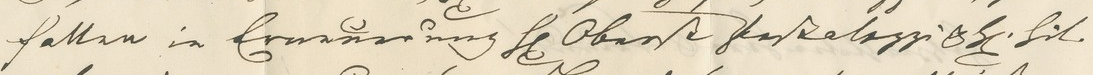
fallen in Erneuerung Herr Oberst Pestalozzi & H. Hil-
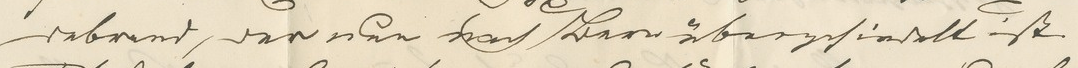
debrand, der nun nach Bern übergesiedelt ist.
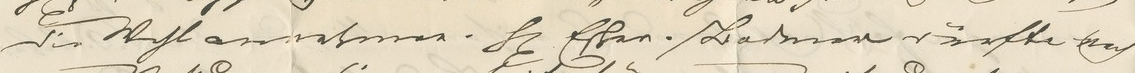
die Wahl annehmen. Herr Escher-Bodmer dürfte nach
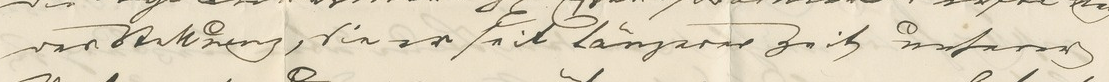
der Stellung, die er seit längerer Zeit unserer
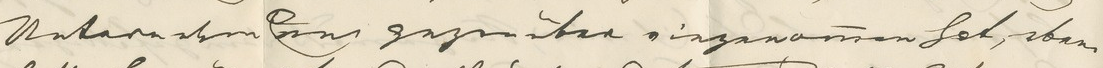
Unternehmung gegenüber eingenommen hat, eben-
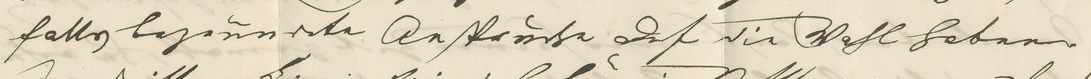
falls begründete Ansprüche auf die Wahl haben.
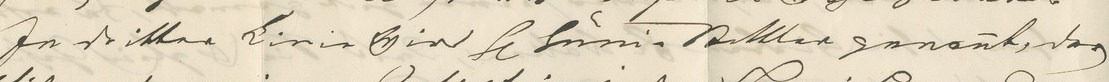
In dritter Linie wird Herr Hüni-Stettler genannt, der
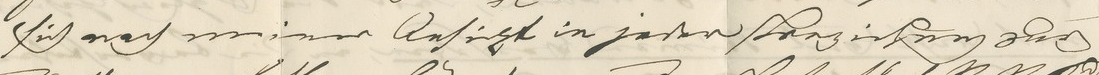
sich nach meiner Ansicht in jeder Beziehung zur
